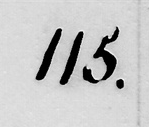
1835.
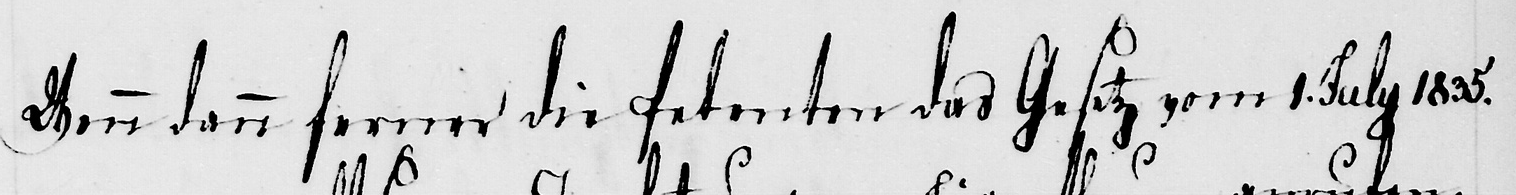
Wenn dann ferner die Petenten das Gesetz vom 1. July
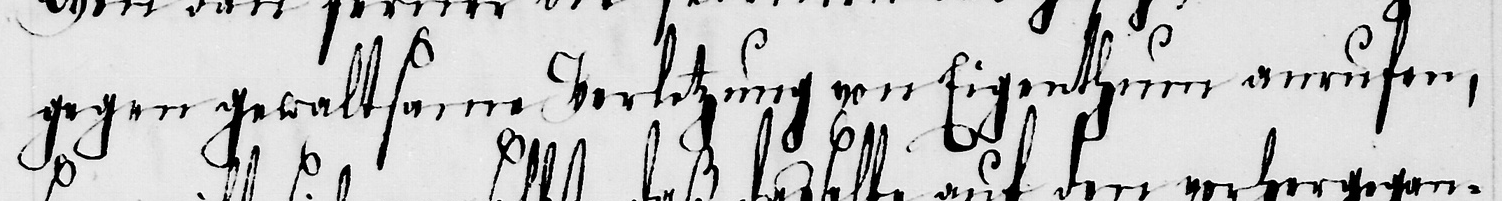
gegen gewaltsame Verletzung von Eigenthum anrufen,
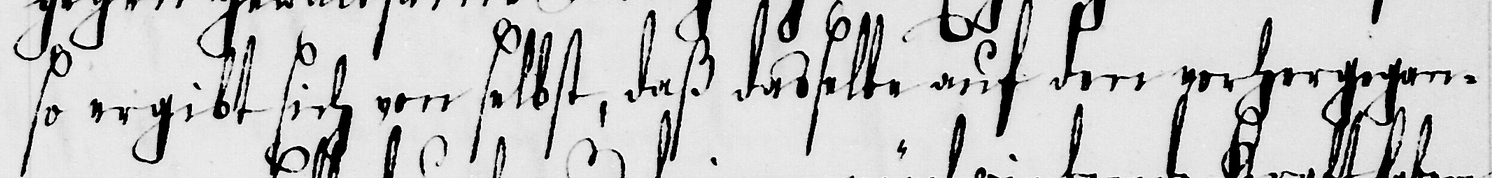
so ergibt sich von selbst, daß dasselbe auf den vorhergegan¬
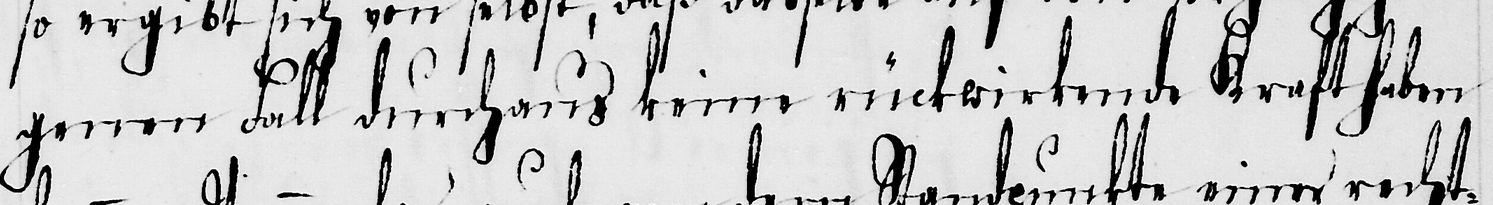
genen Fall durchaus keine rückwirkende Kraft haben
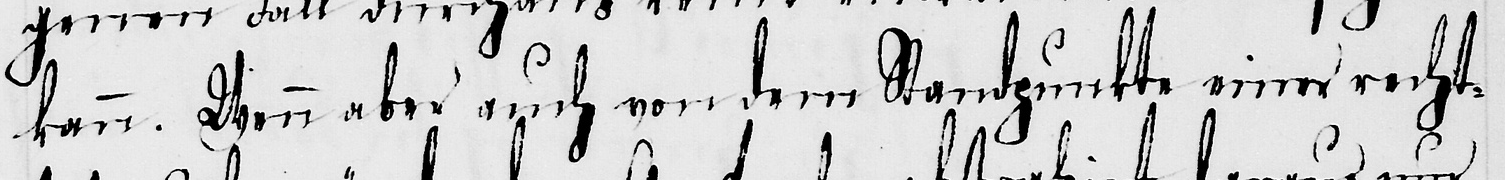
kann. Wenn aber auch von dem Standpunkte einer recht¬
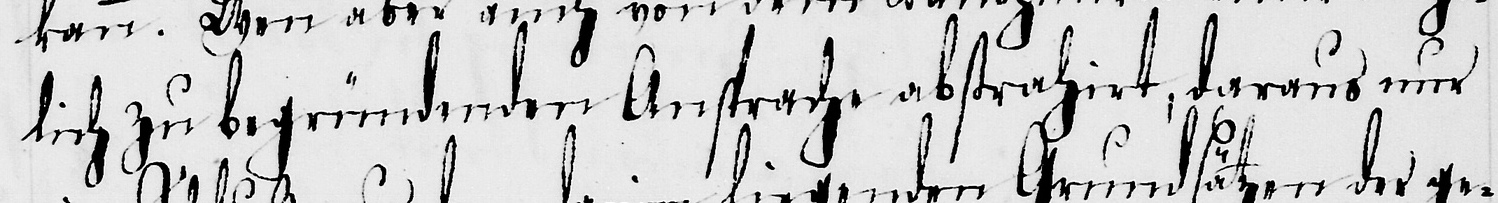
lich zu begründenden Ansprache abstrahirt, daraus nur
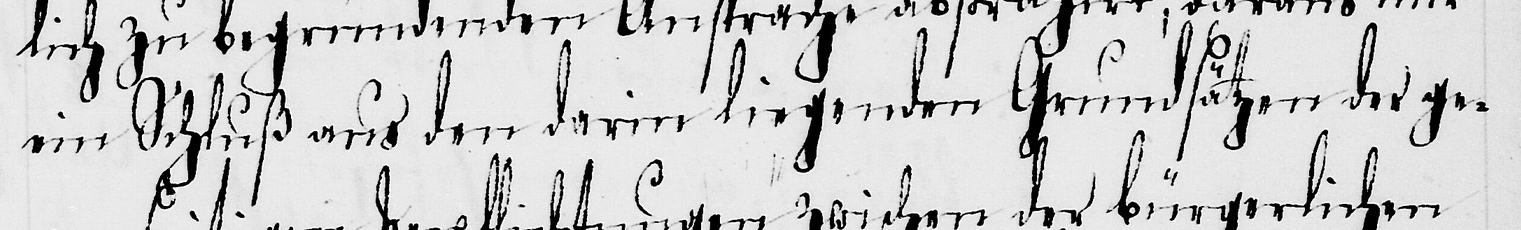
ein Schluß aus den darin liegenden Grundsätzen der ge¬
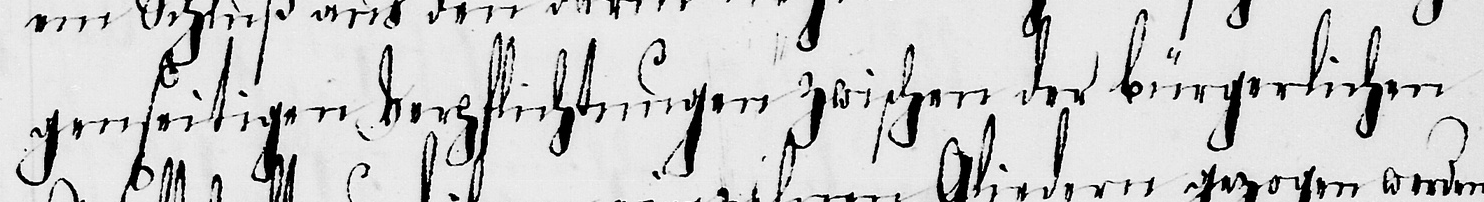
genseitigen Verpflichtungen zwischen der bürgerlichen
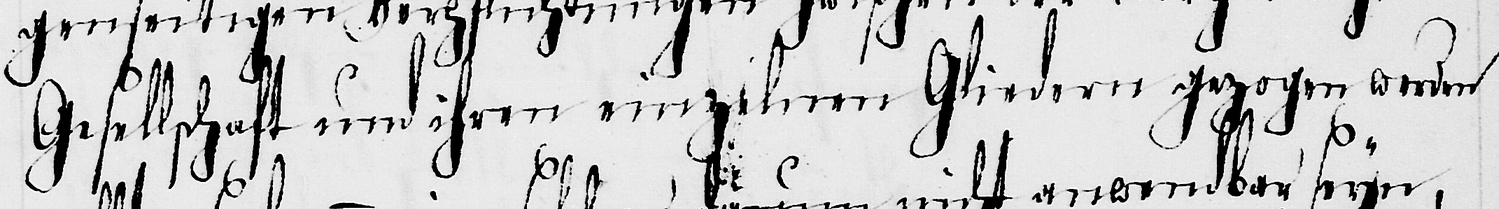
Gesellschaft und ihren einzelnen Gliedern gezogen werden
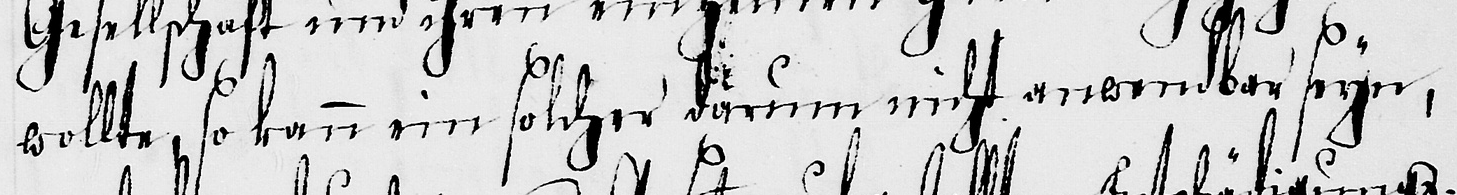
wollte, so kann ein solcher darum nicht anwendbar seyn,
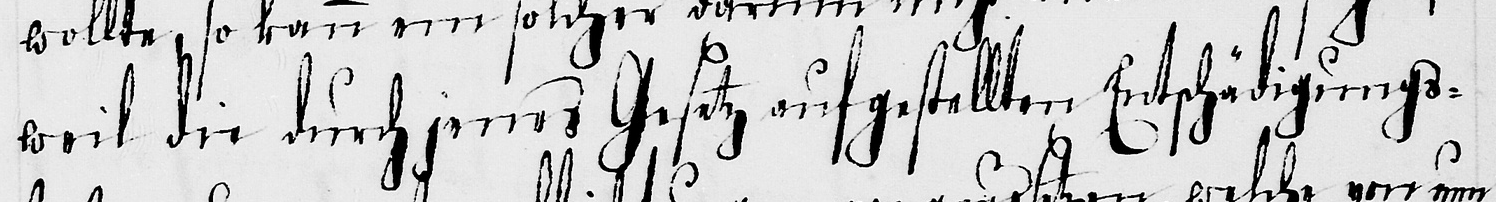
weil die durch jenes Gesetz aufgestellten Entschädigungs¬
